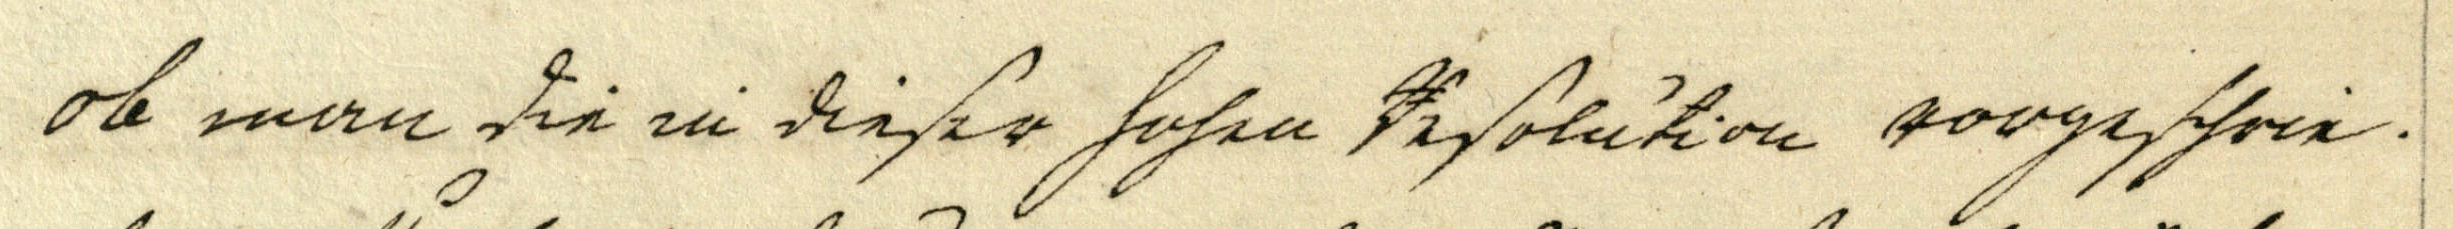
ob man die in dieser hohen Resolution vorgeschrie¬
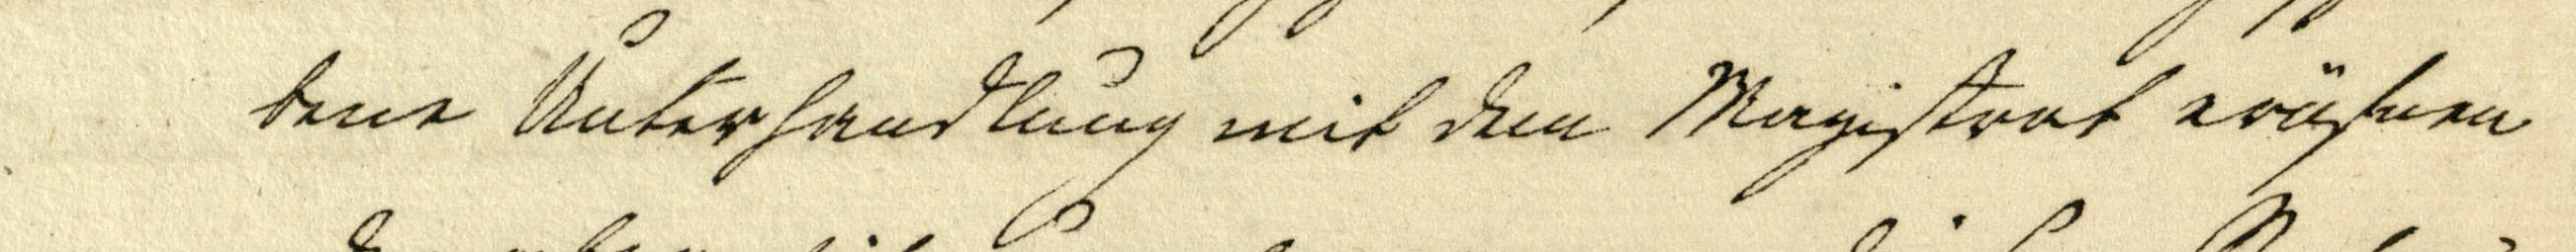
bene Unterhandlung mit dem Magistrat eröfnen
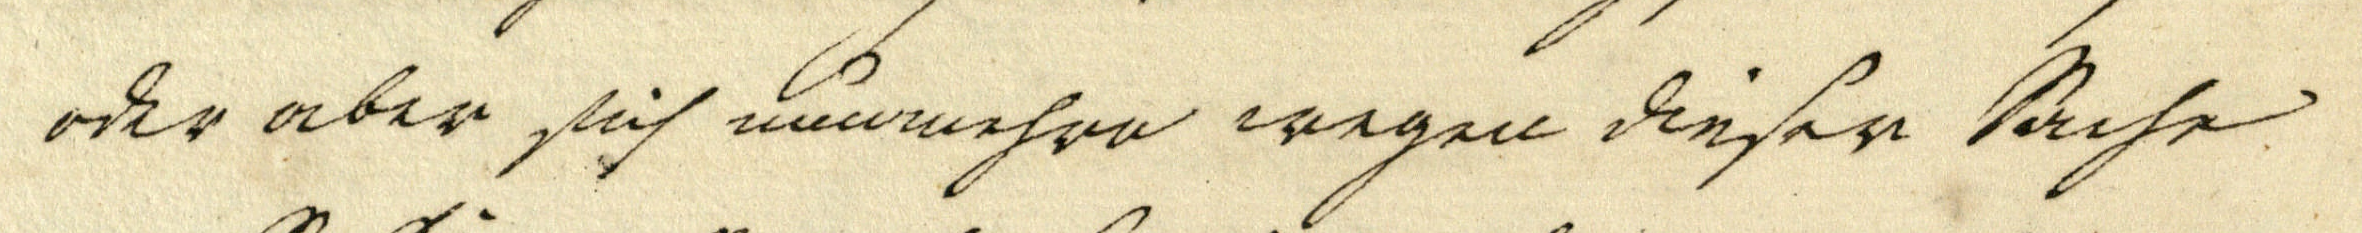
oder aber sich nunmehro wegen dieser Sache
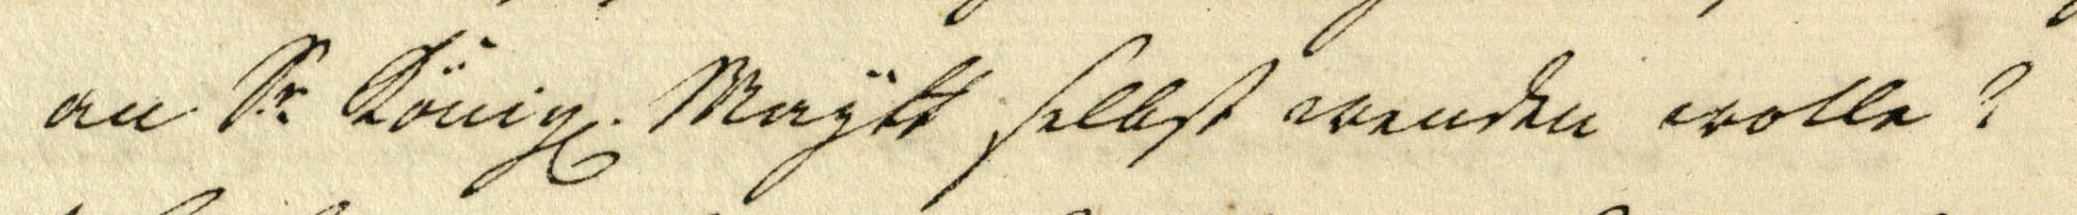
an Sr. Königl. Maÿtt. selbst wenden wolle?
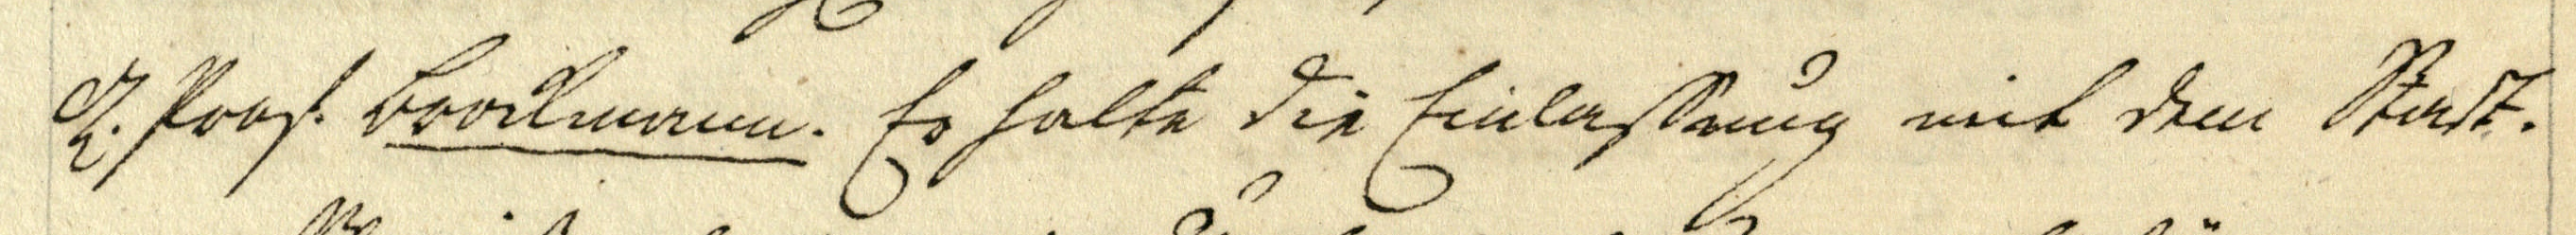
dh. Prof. Brockmann. Er halte die Einlassung mit dem Stadt¬
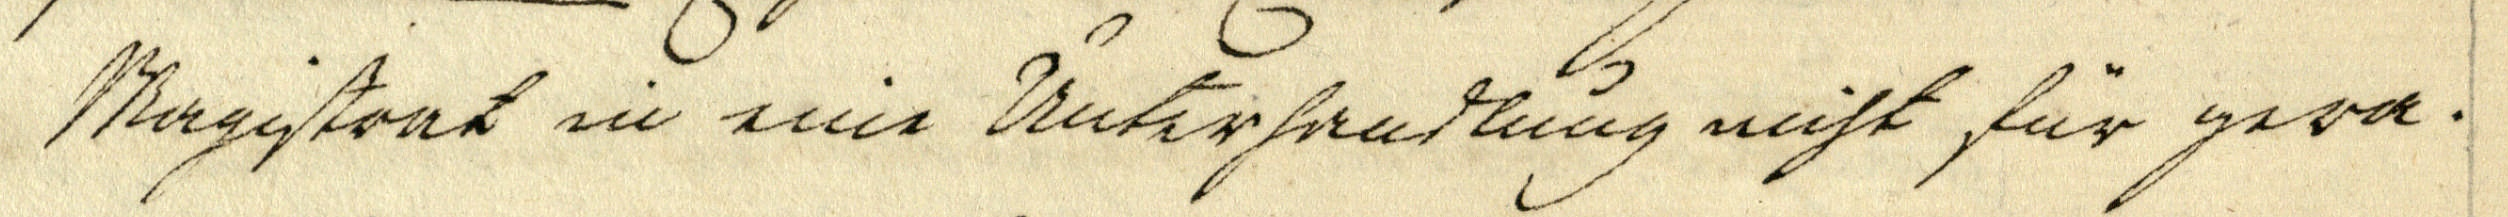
Magistrat in eine Unterhandlung nicht für gera¬
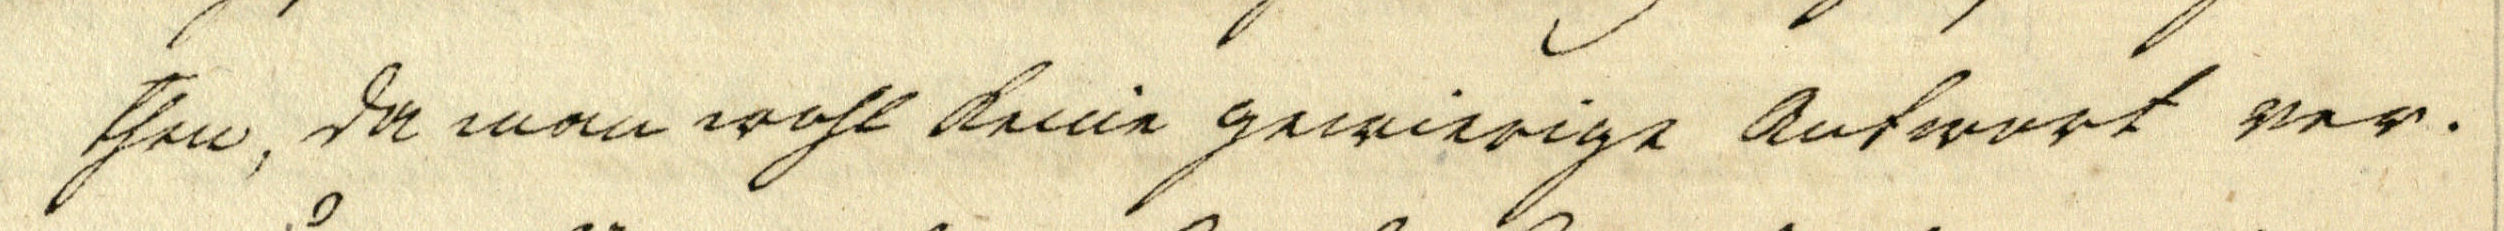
then, da man wohl keine gewierige Antwort ver¬
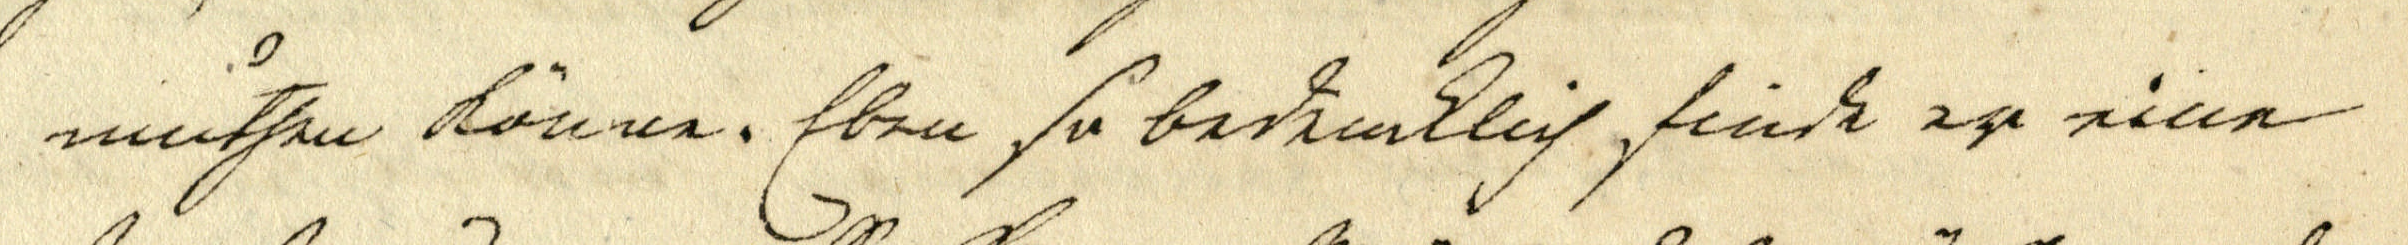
muthen könne. Eben so bedencklich finde er eine
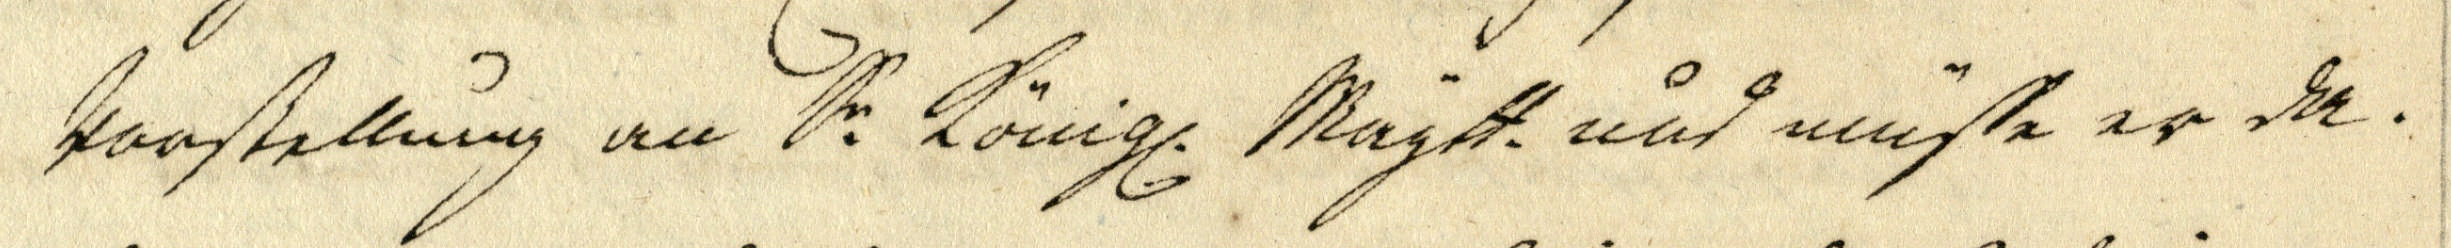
Vorstellung an Sr. Königl. Maÿtt. und müsse er da¬
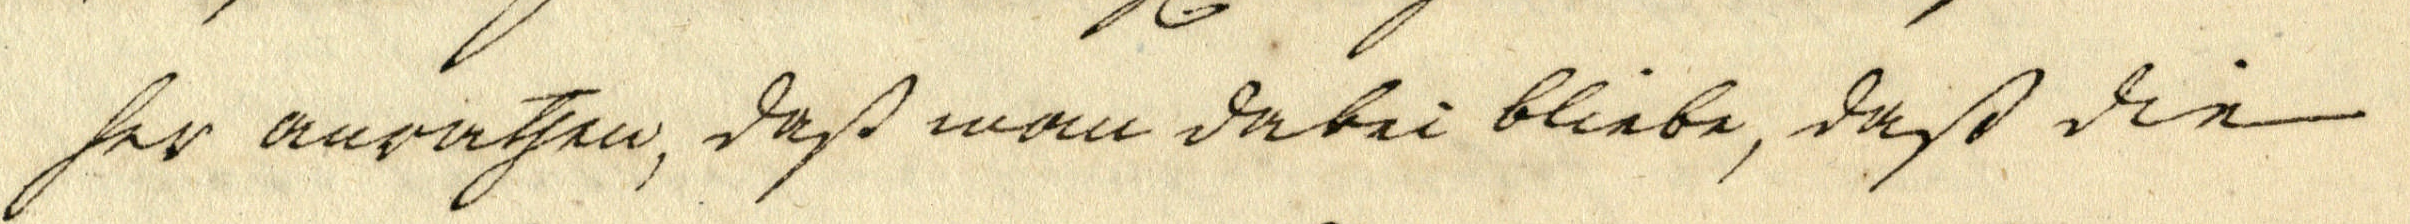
her anrathen, daß man dabei bliebe, daß die
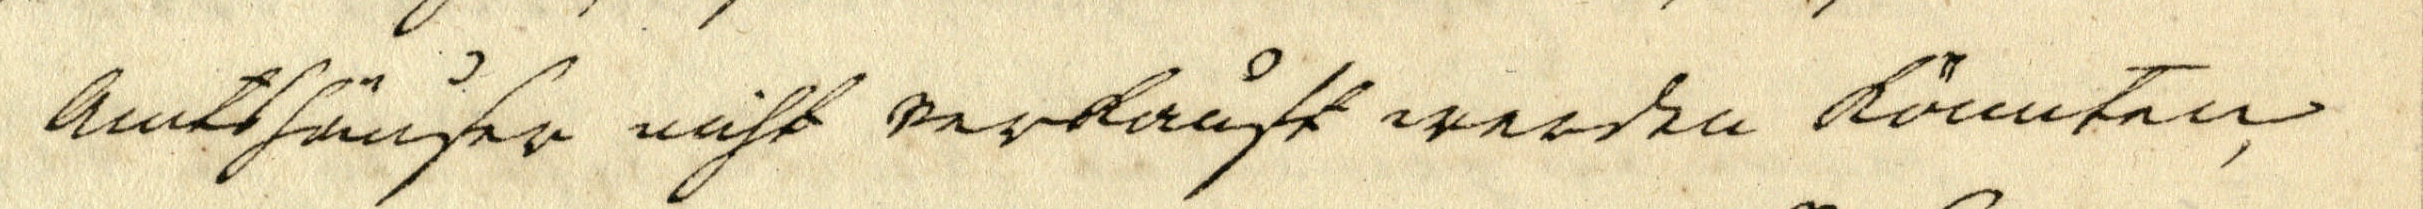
Amtshäuser nicht verkauft werden könnten
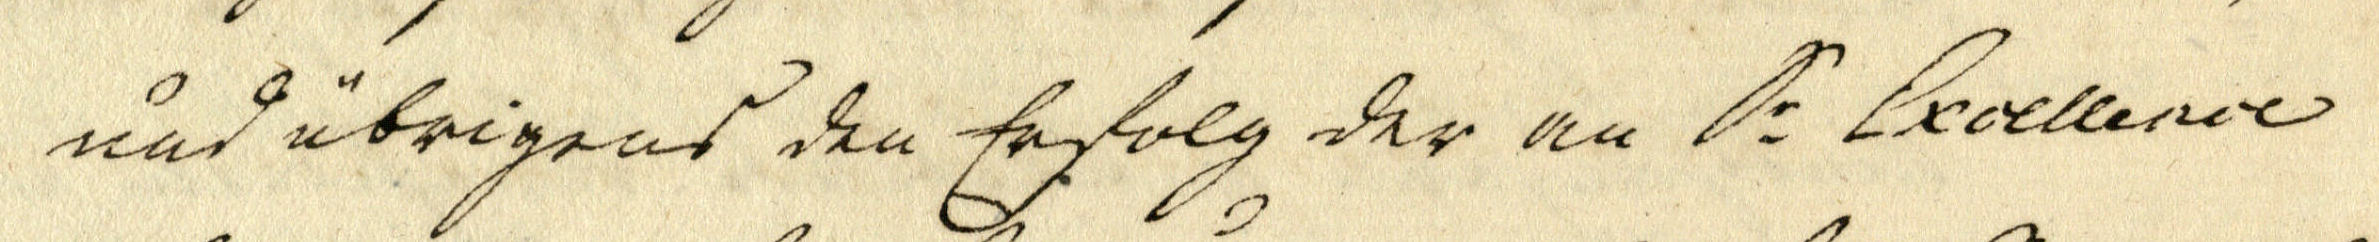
und übrigens den Erfolg der an Sr. Excellence
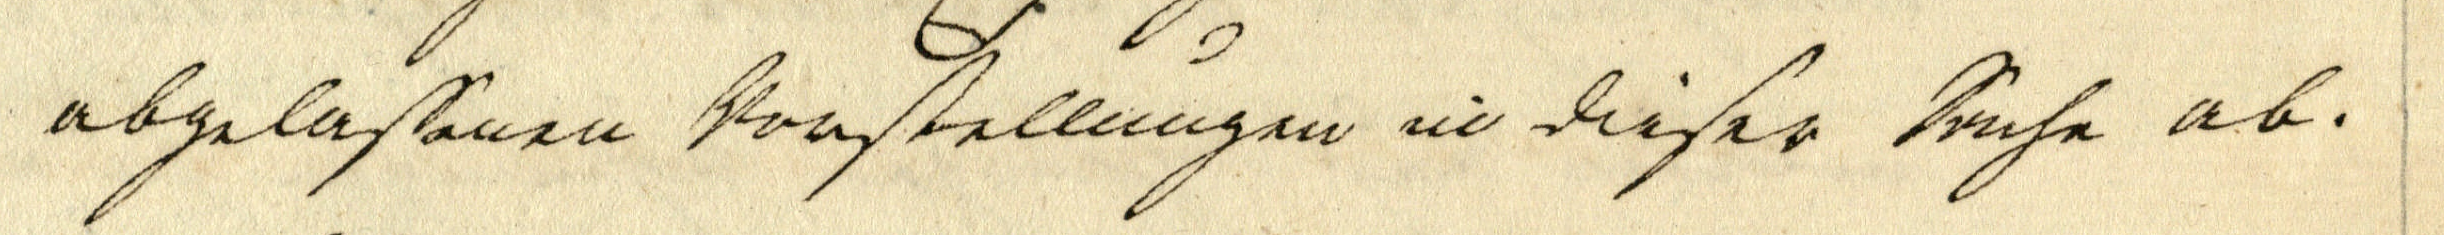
abgelassenen Vorstellungen in dieser Sache ab¬
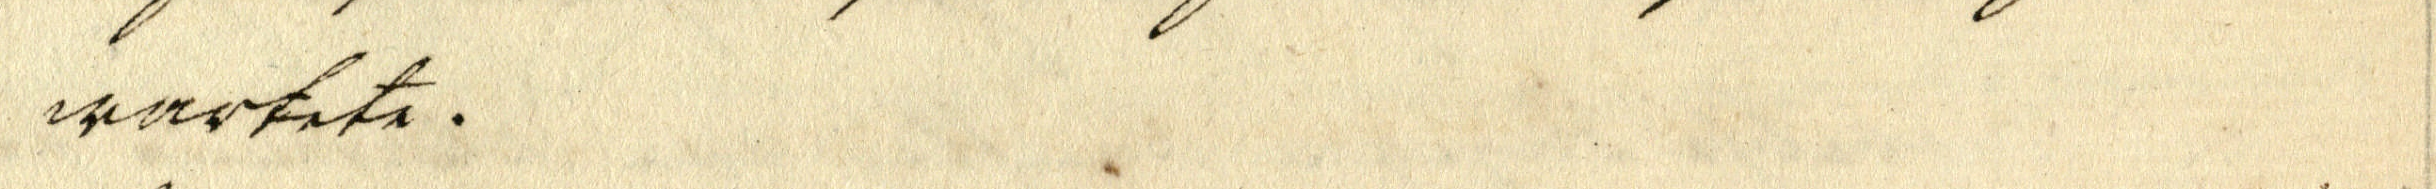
wartete.
